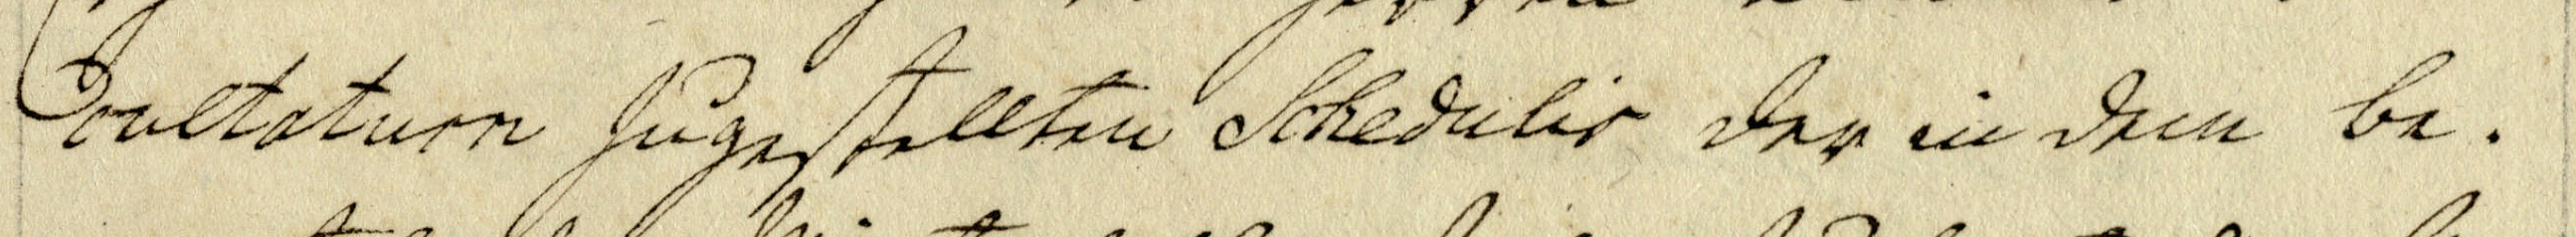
cultatum zugestellten Schedulis der in dem be¬
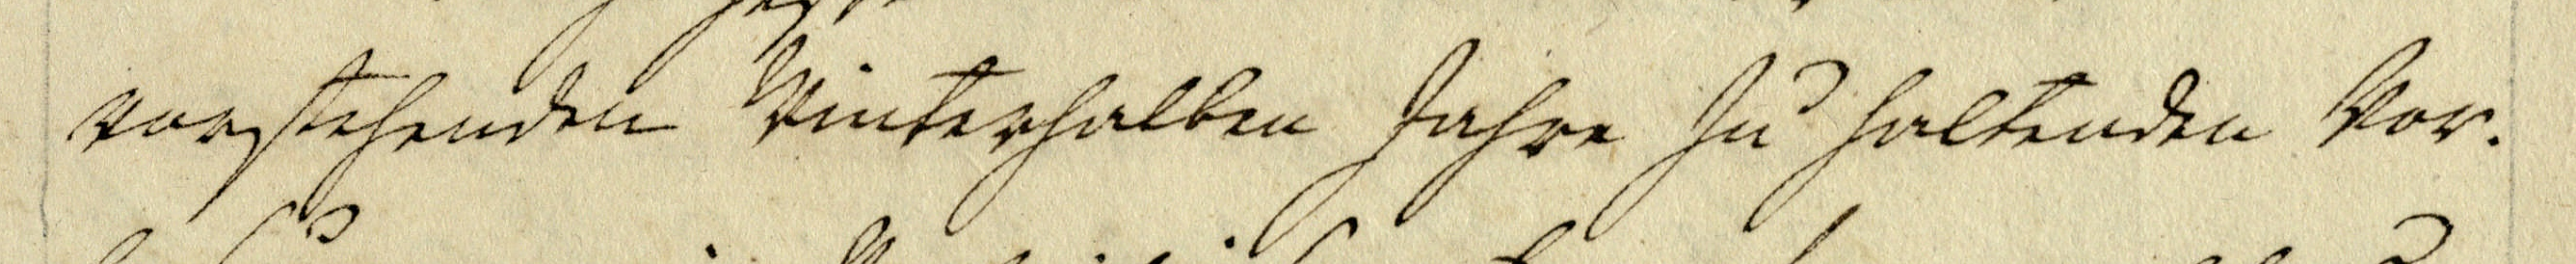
vorstehenden Winterhalben Jahre zu haltenden Vor¬
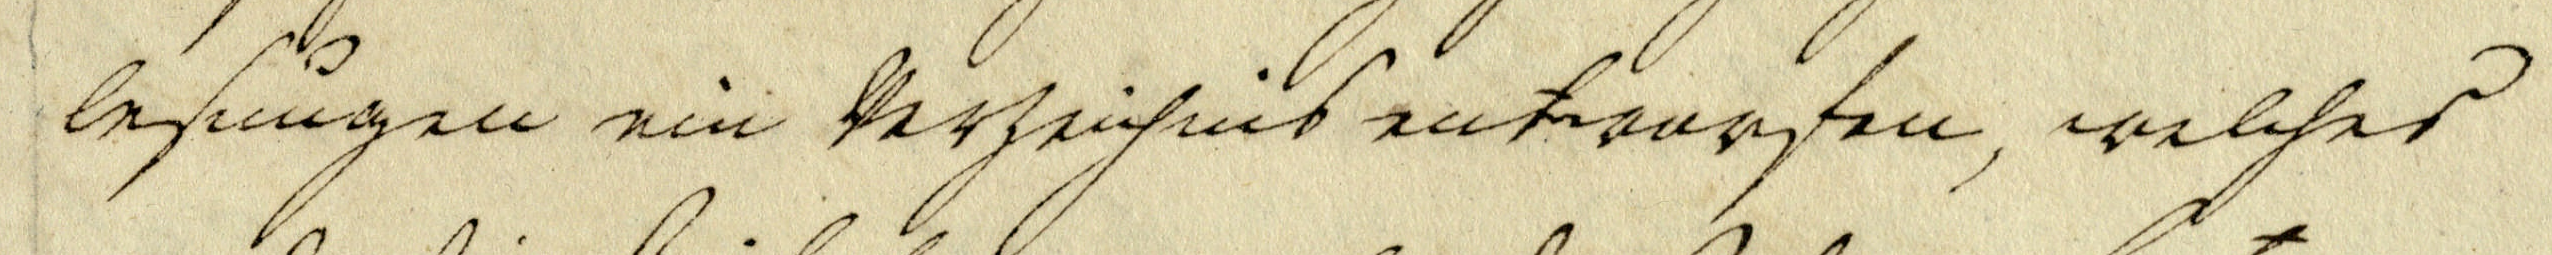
lesungen ein Verzeichnis entworfen, welches
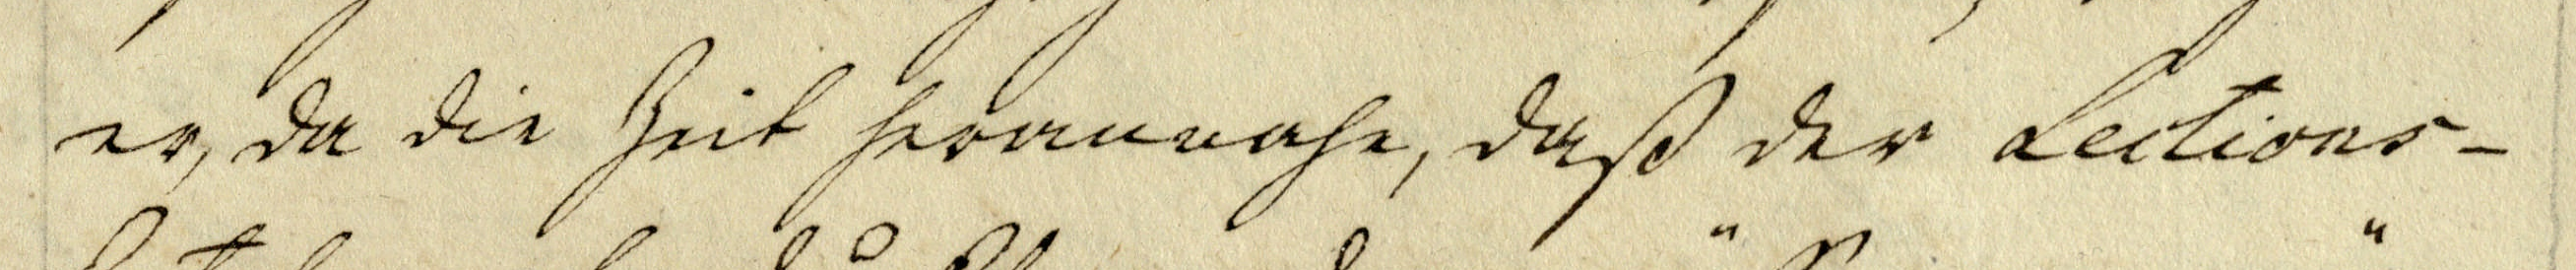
er, da die Zeit herannahe, daß der Lections¬
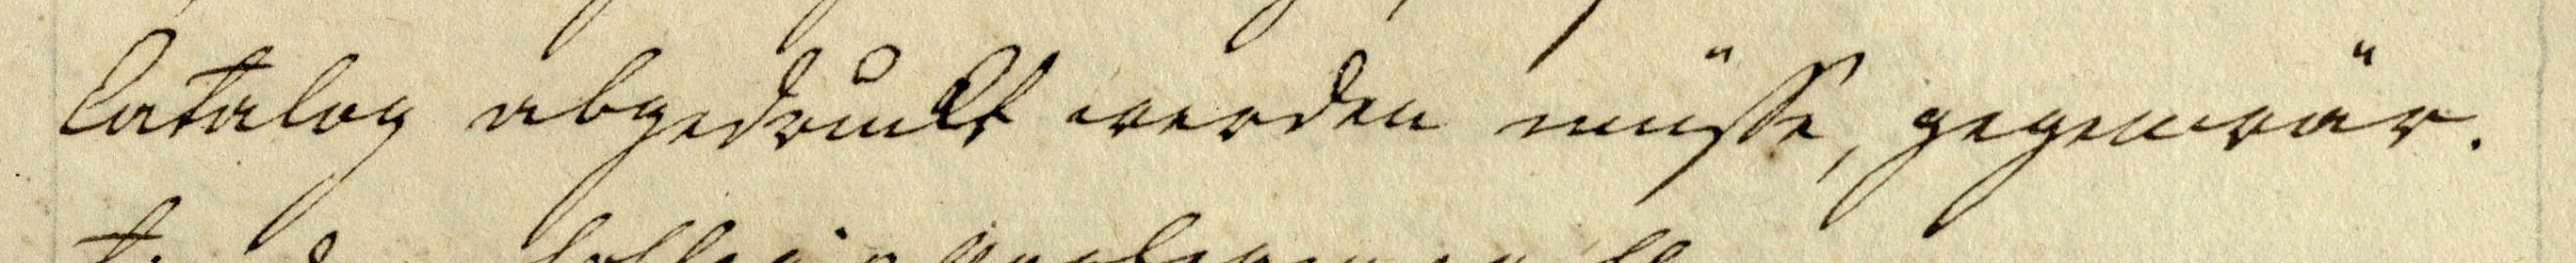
Catalog abgedruckt werden müsse, gegenwär¬
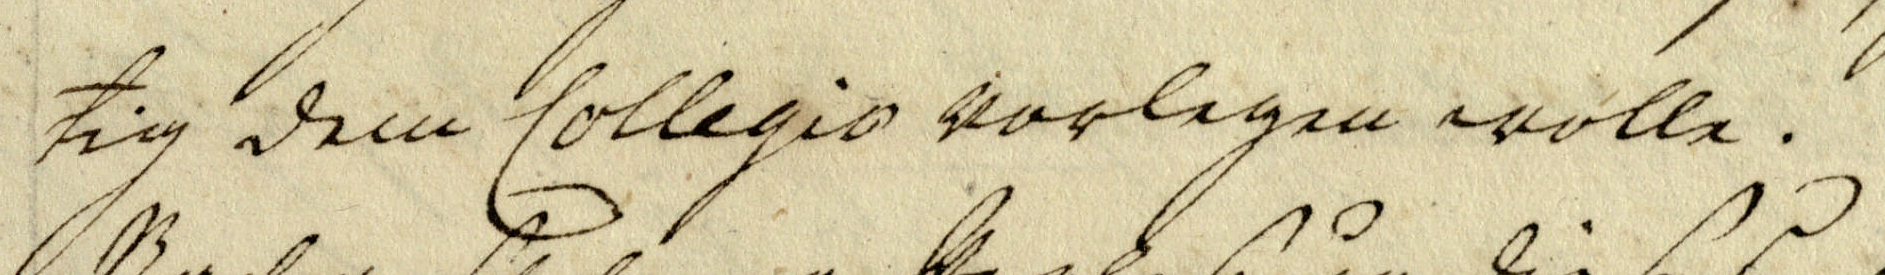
tig dem Collegio vorlegen wolle.
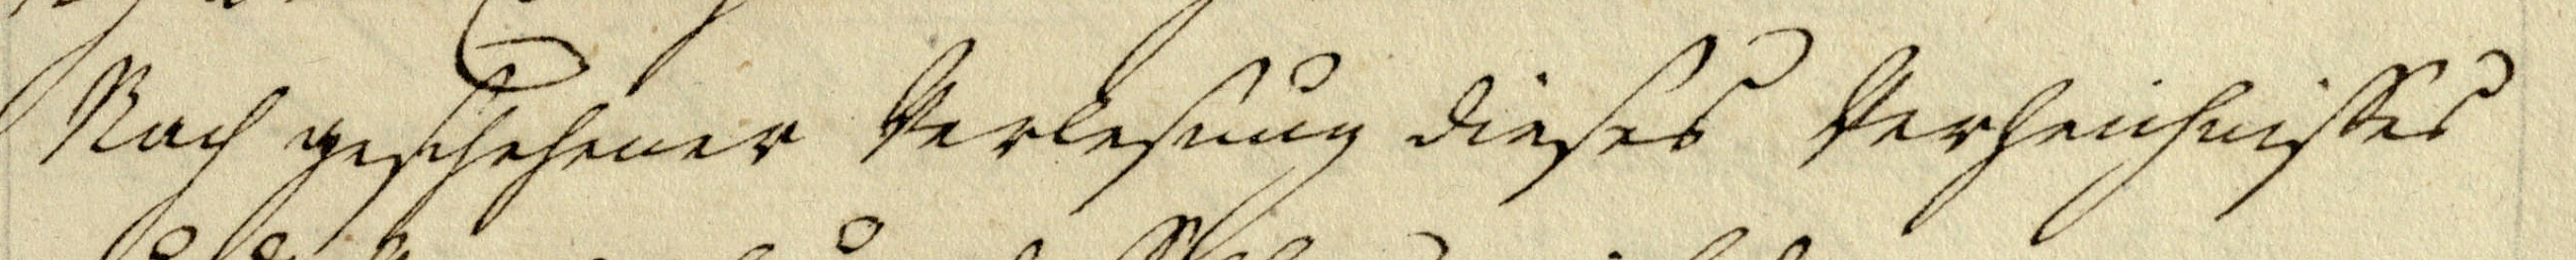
Nach geschehener Verlesung dieses Verzeichnisses
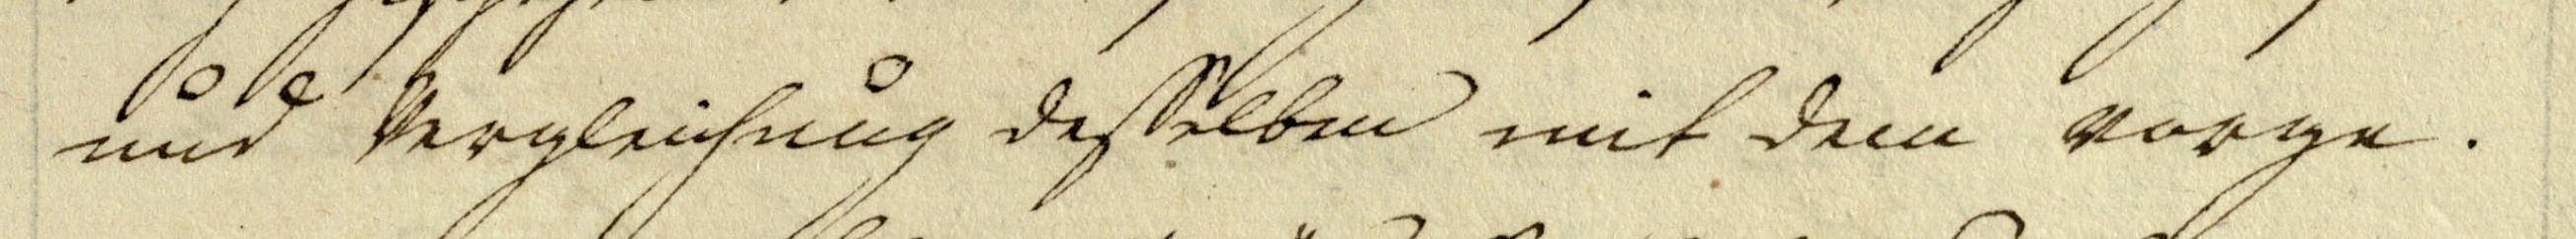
und Verleichung desselben mit dem vorge¬
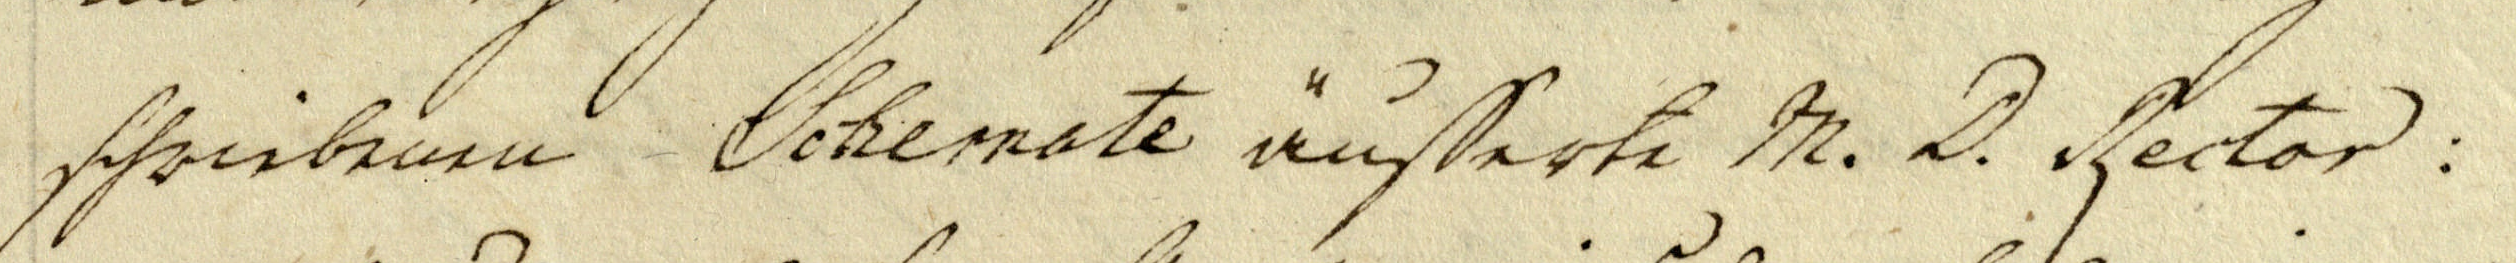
schriebenen Schemate äusserte M. D. Rector:
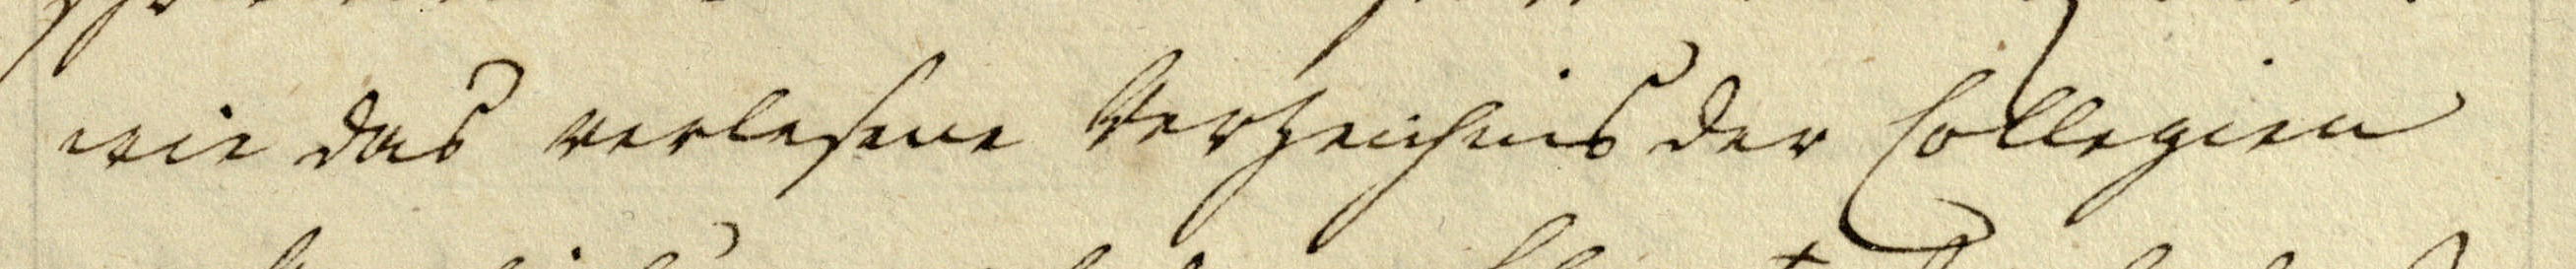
wie das verlesene Verzeichnis der Collegien
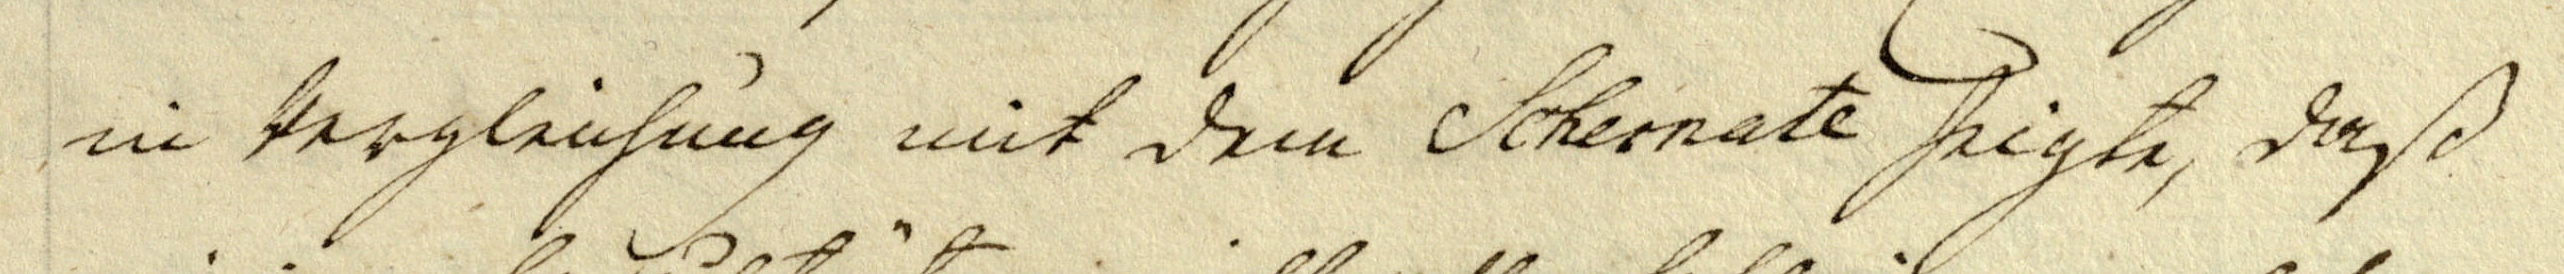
in Vergleichung mit dem Schemate zeigte, daß
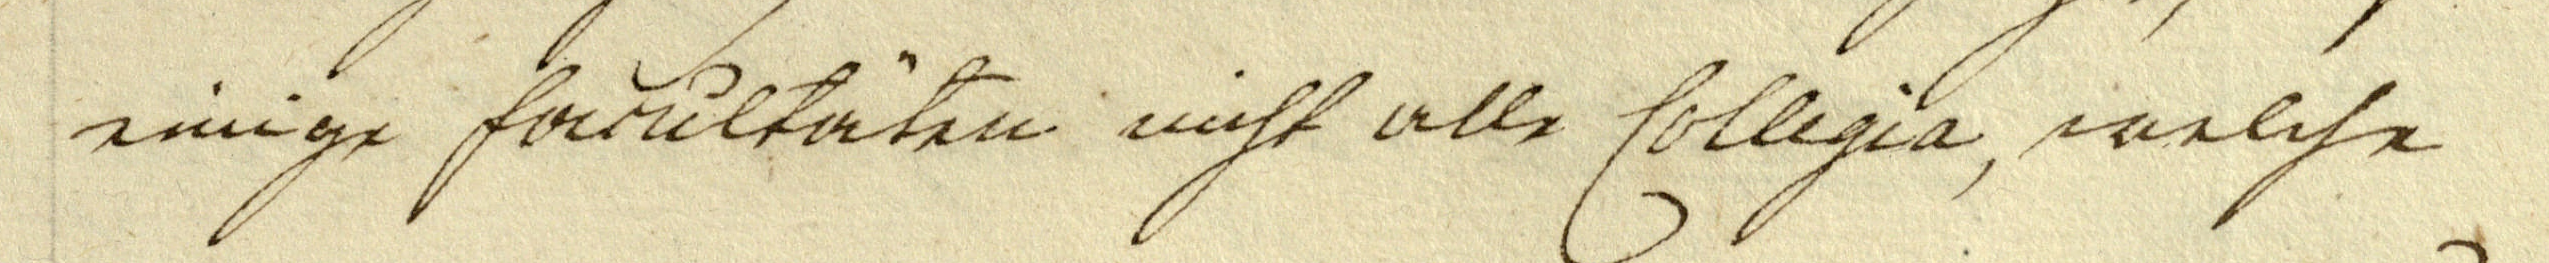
einige Facultäten nicht alle Collegia, welche
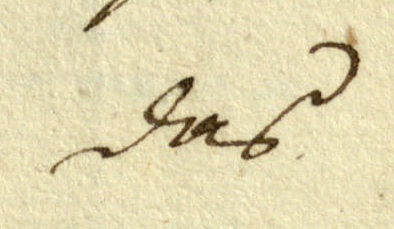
das
